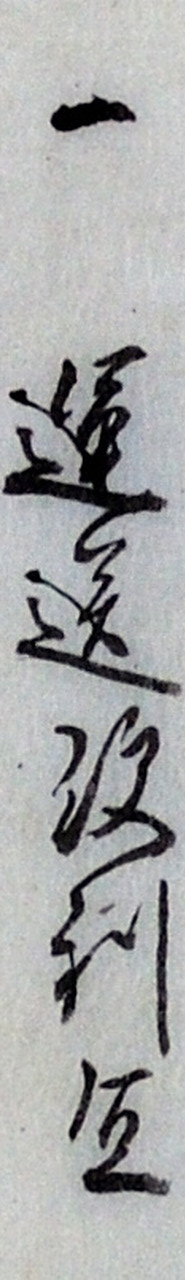一運送便利宜
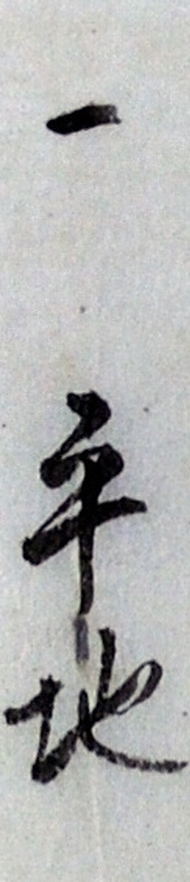一平地

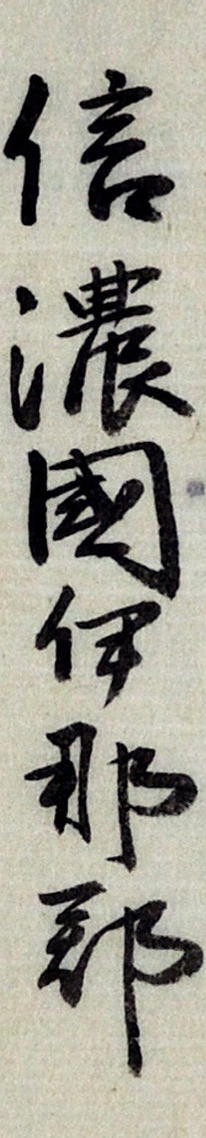信濃国伊那郡
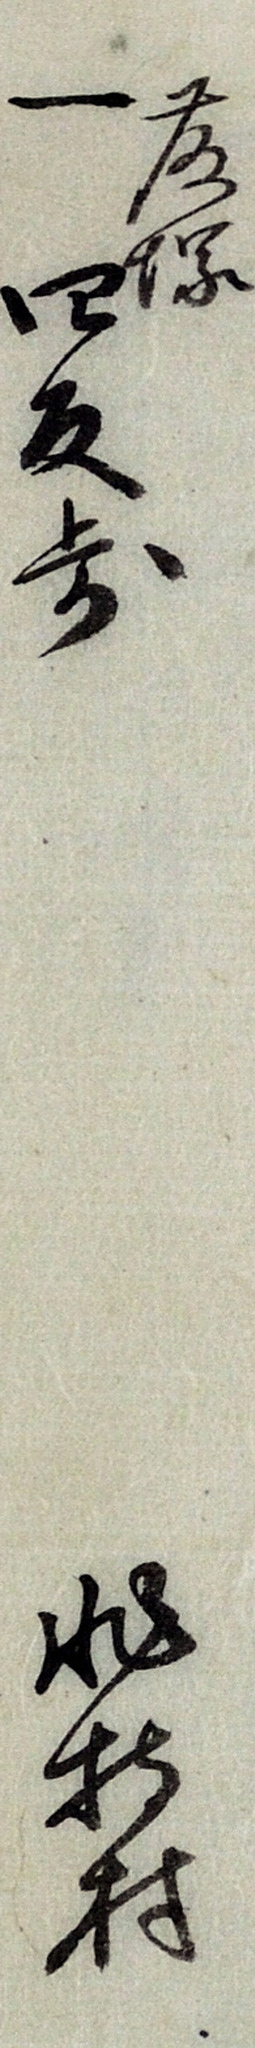一四反歩非持村
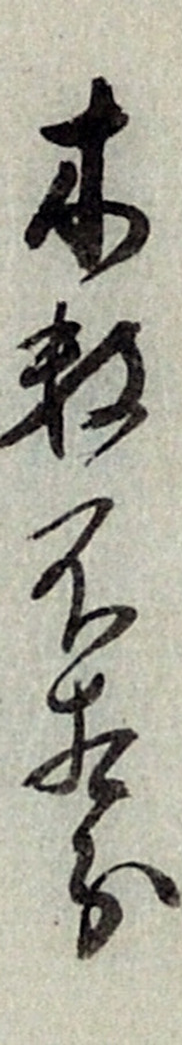木数不相分
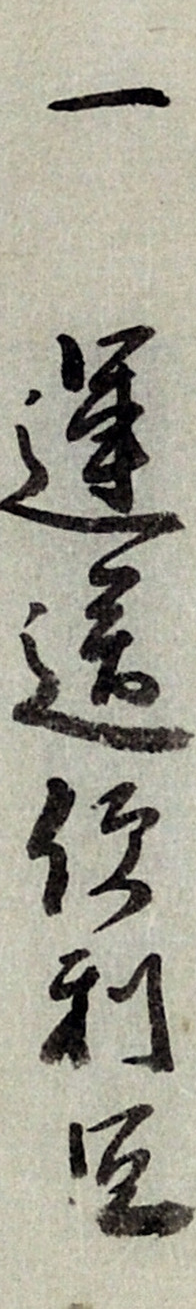一運送便利宜

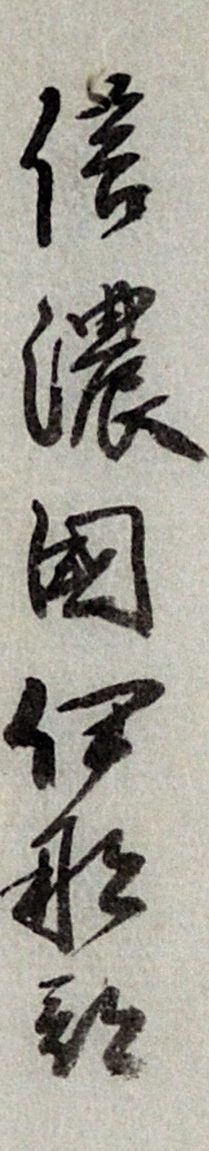信濃国伊那郡
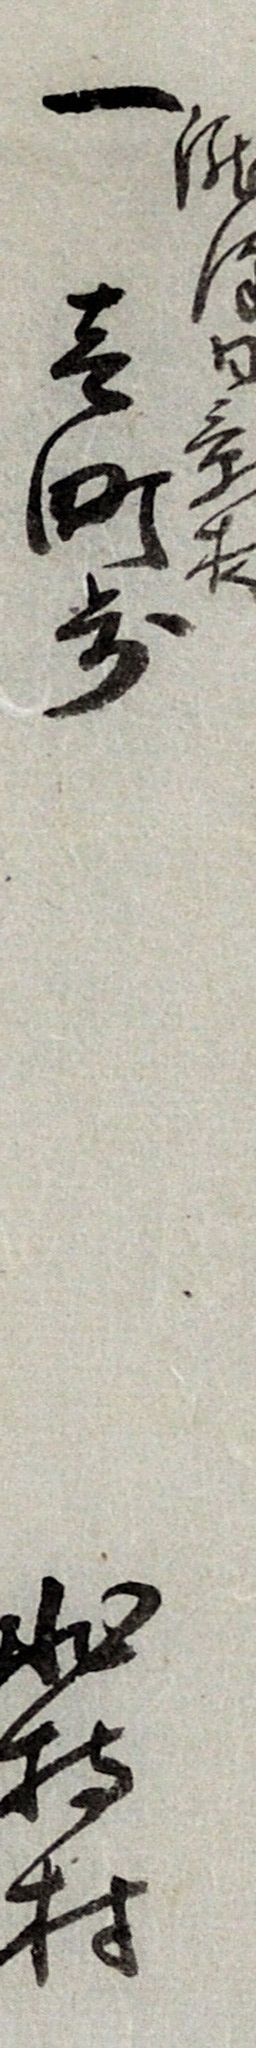一壱町歩非持村
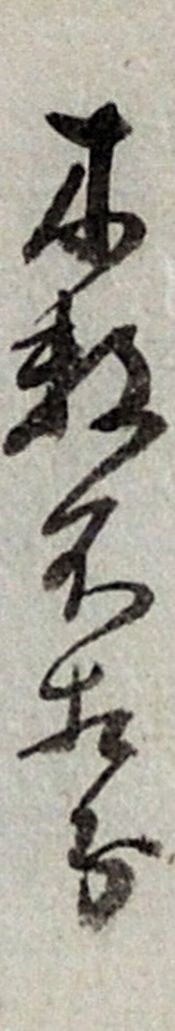木数不相分
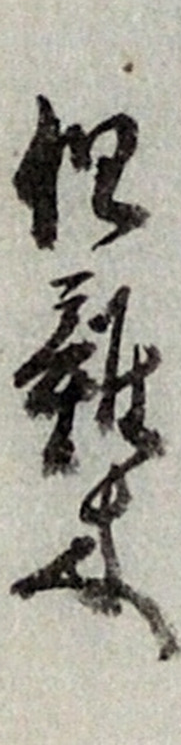但雑木
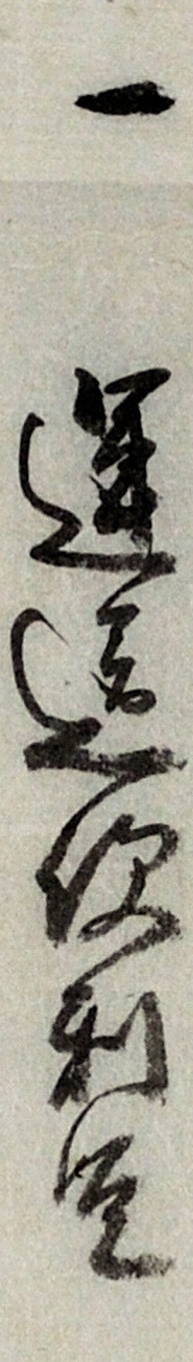一運送便利宜
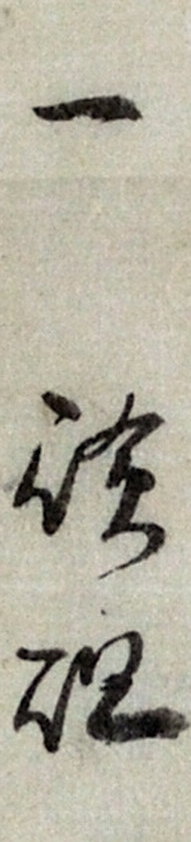一嶮岨
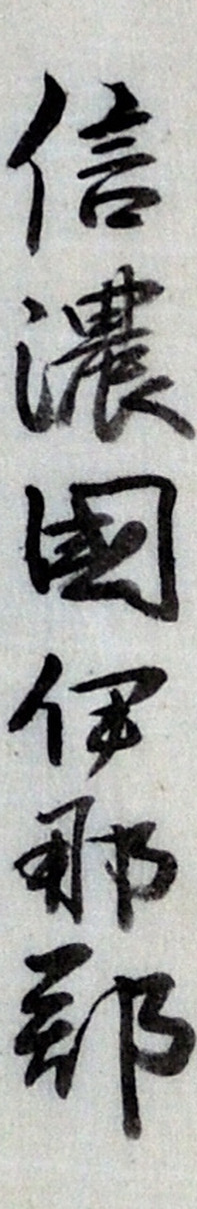信濃国伊那郡
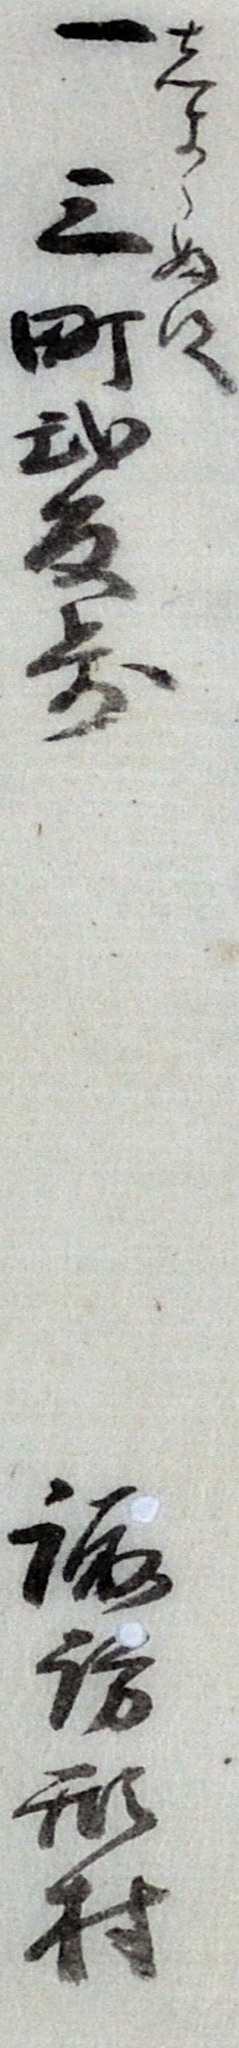一三町弐反歩諏訪形村
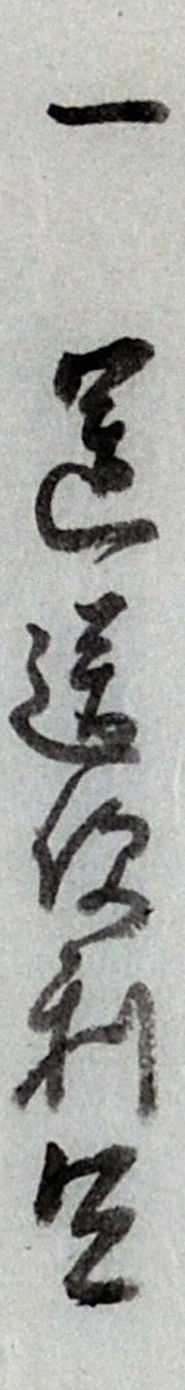一運送便利宜
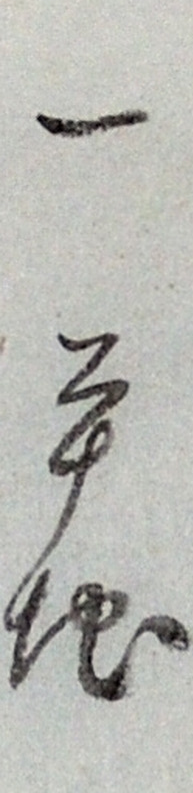一平地
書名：官林反別帳
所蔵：伊那市立高遠町図書館・合同会社AMANE
